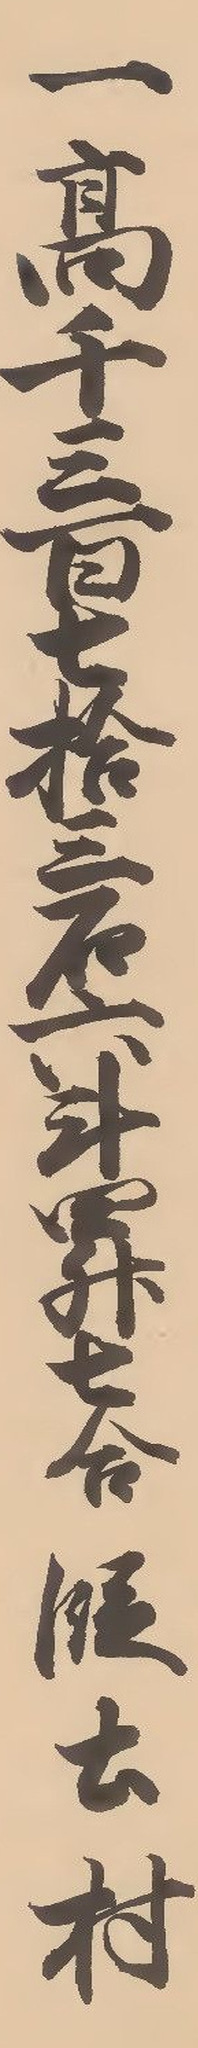一高千三百七拾三石六斗四升七合段土村
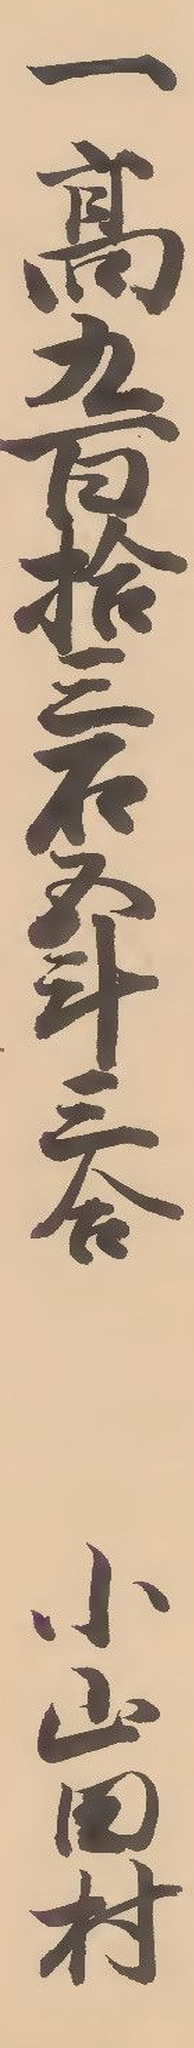一高九百拾三石五斗三合小山田村

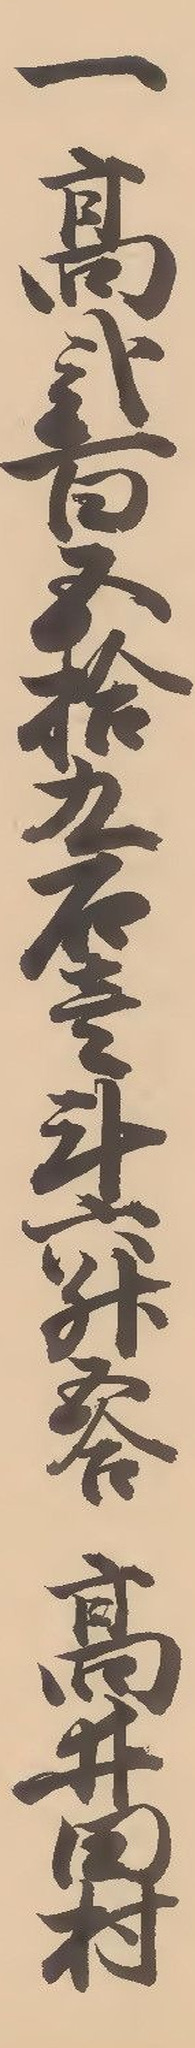一高弐百五拾九石壱斗六升五合高井田村
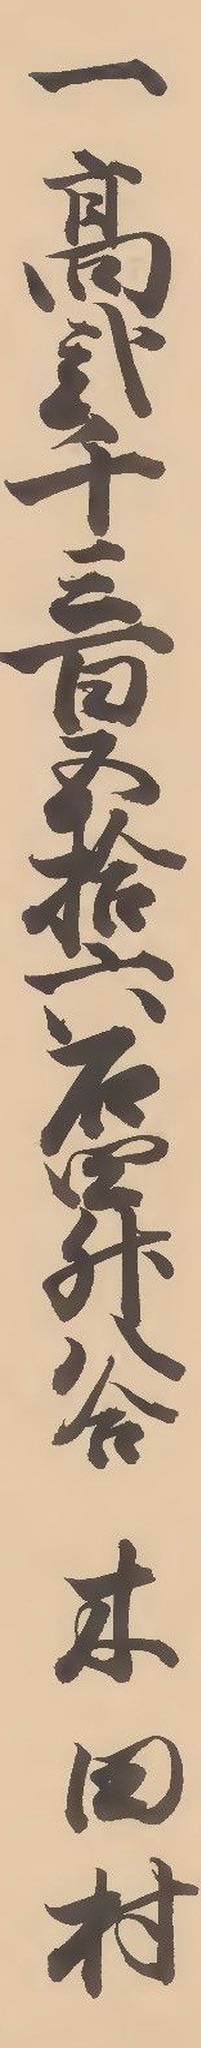一高弐千三百五拾六石四升八合木田村
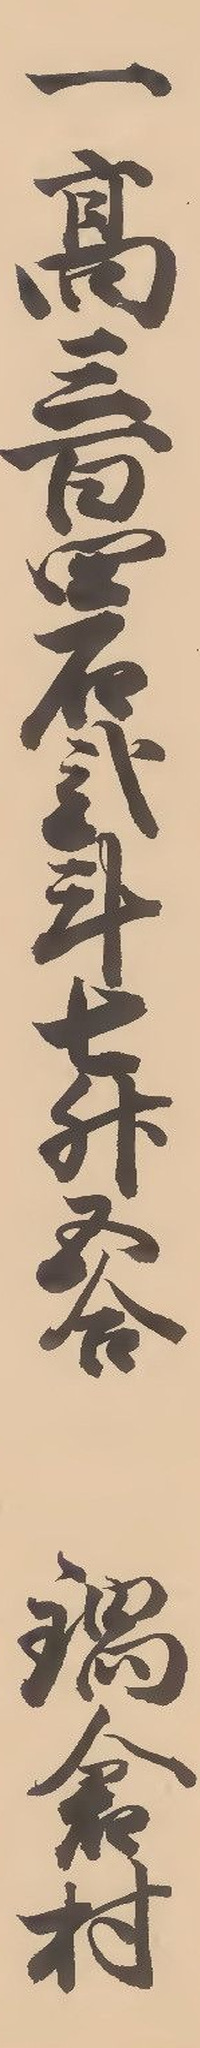一高三百四石弐斗七升五合鍋倉村
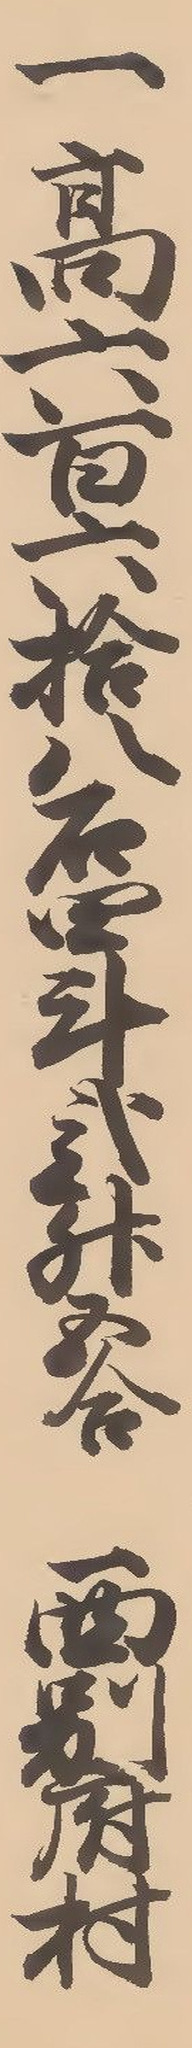一高六百六拾八石四斗弐升五合西別府村
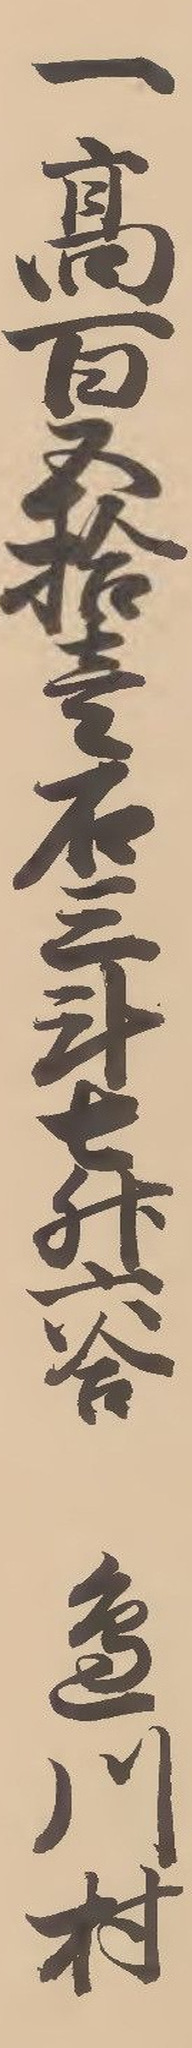一高百五拾壱石三斗七升六合辺川村
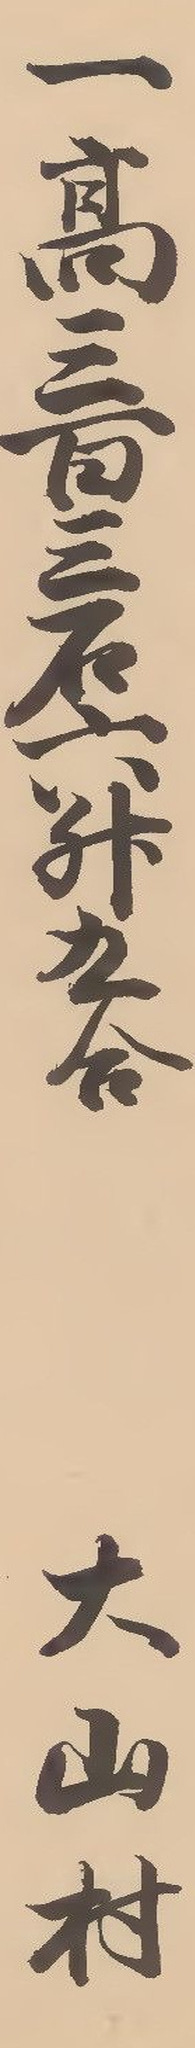一高三百三石六升九合大山村
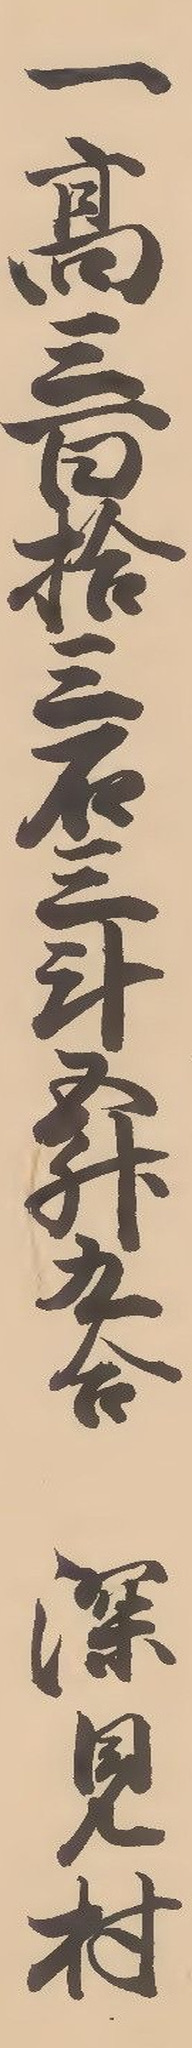一高三百拾三石三斗五升九合深見村
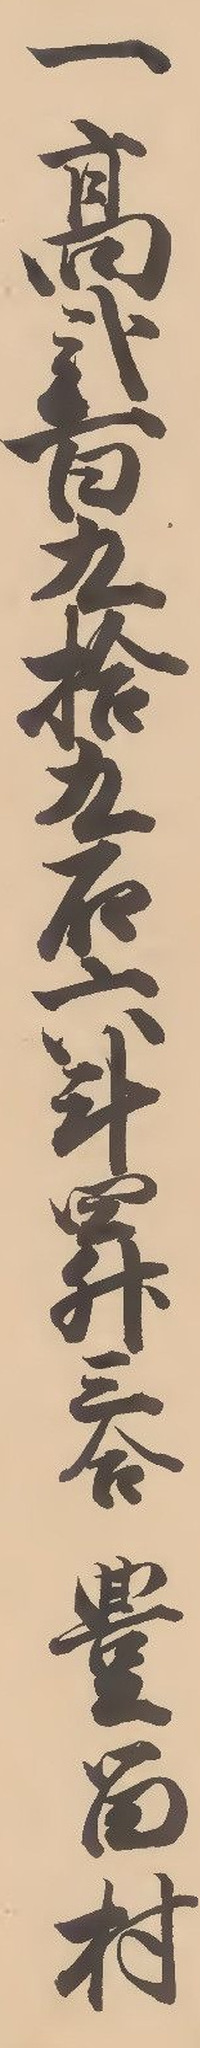一高弐百九拾九石六斗四升三合豊留村

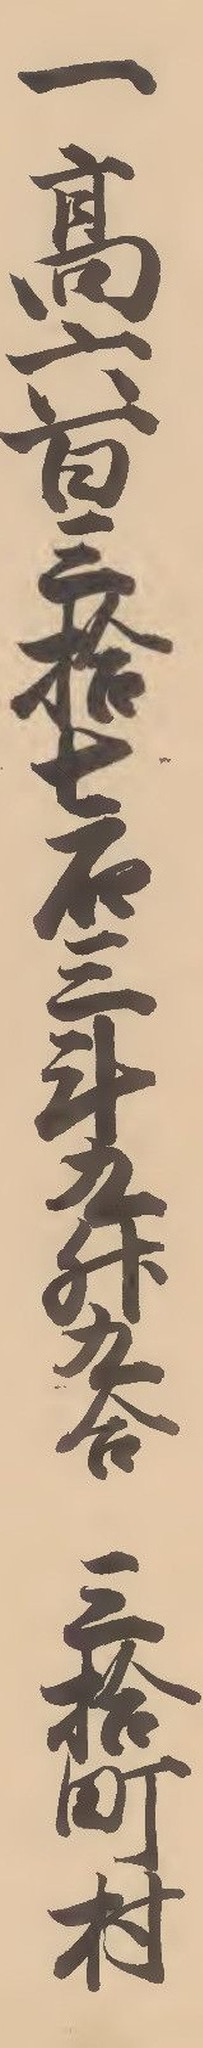一高六百三拾七石三斗九升九合三拾町村
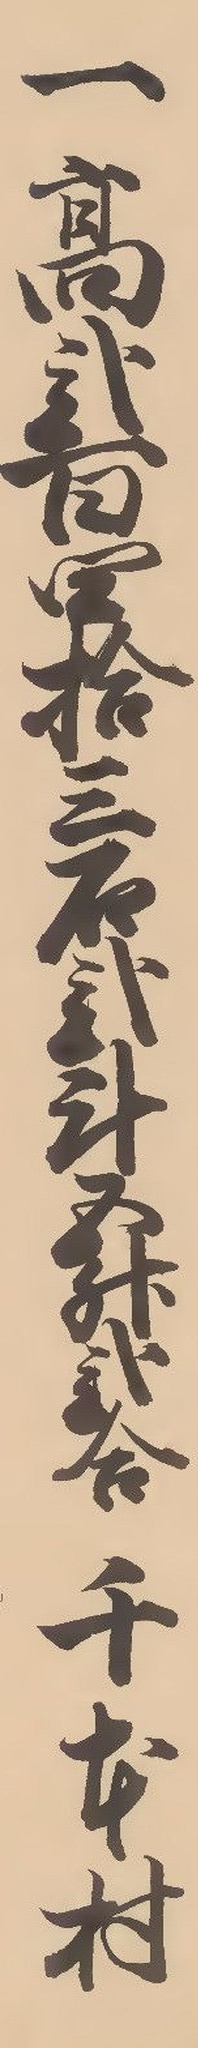一高弐百四拾三石弐斗五升弐合千本村
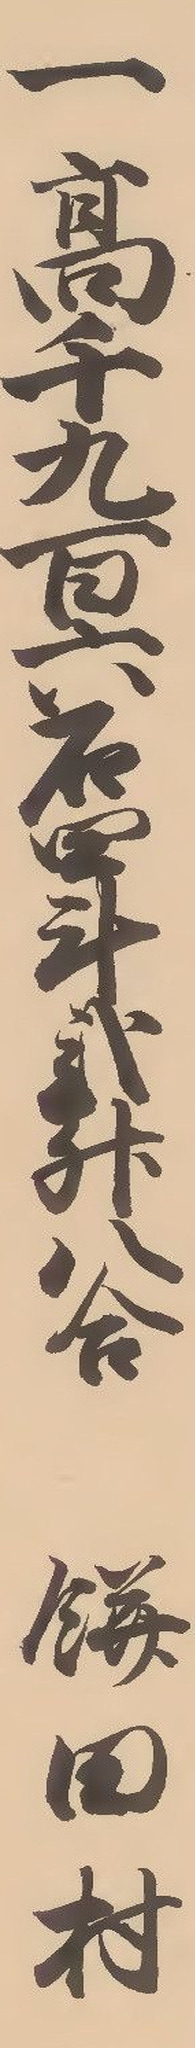一高千九百六石四斗弐升八合餅田村
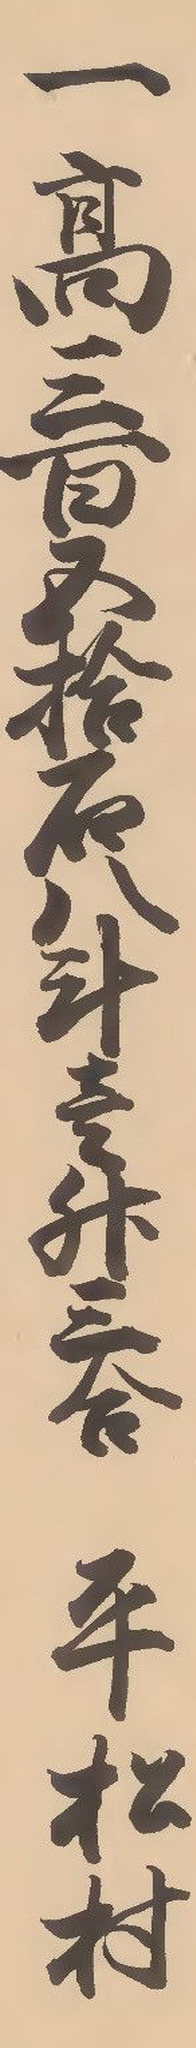一高三百五拾石八斗壱升三合平松村
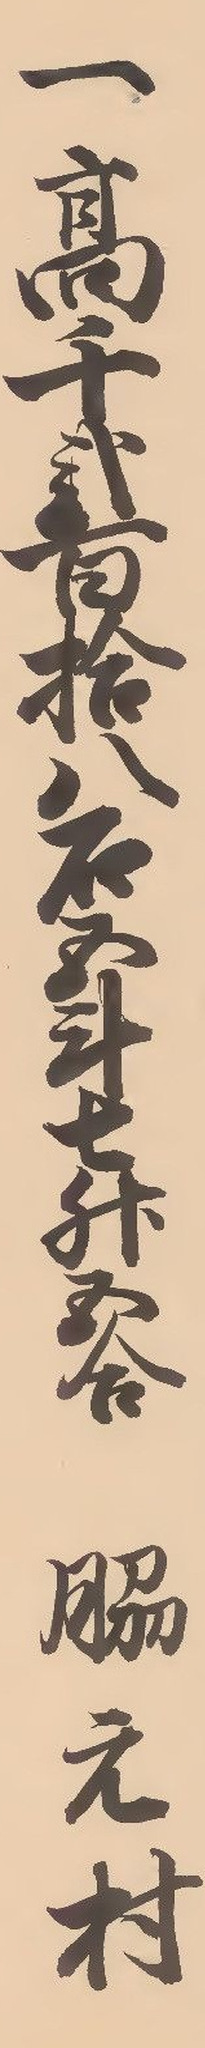一高千弐百拾八石五斗七升五合脇元村
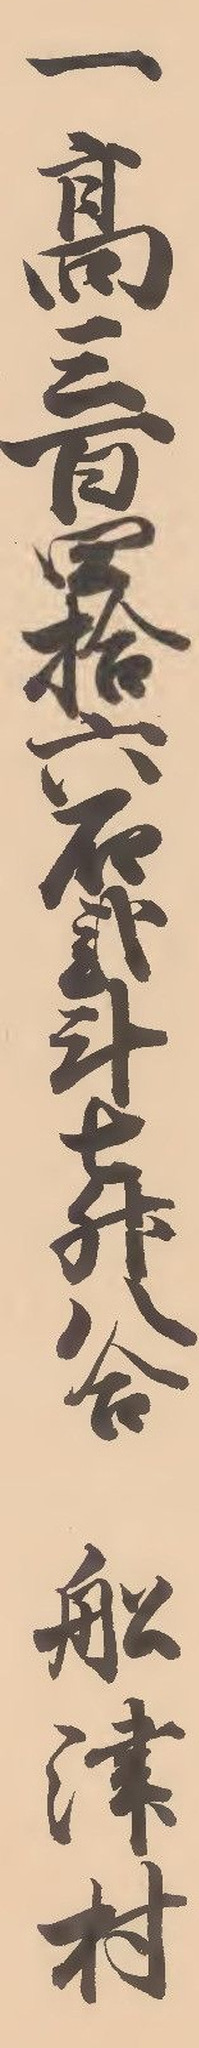一高三百四拾六石弐斗七升八合船津村
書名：大隅国郷帳
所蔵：国立公文書館 National Archives of Japan
